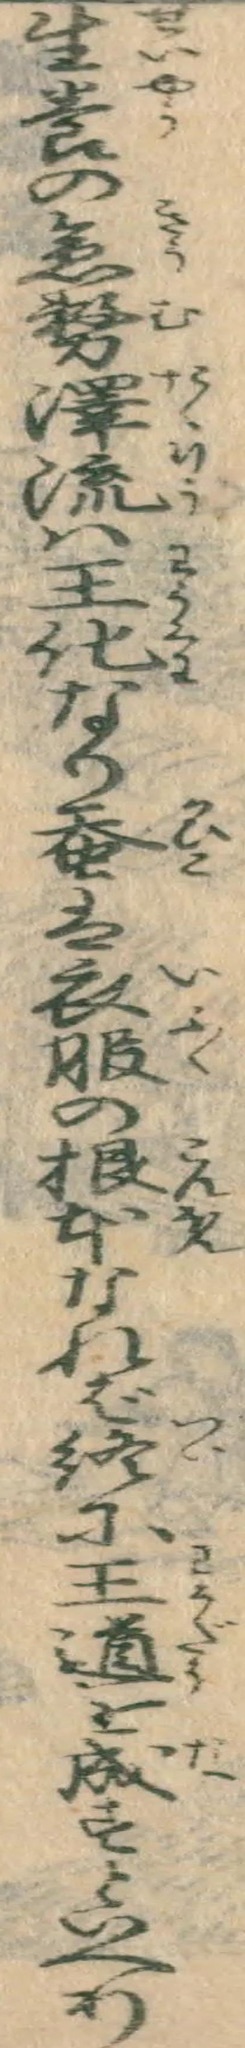生養の急務沢流は王化なり蚕は衣服の根本なれば終に王道を成すといへり
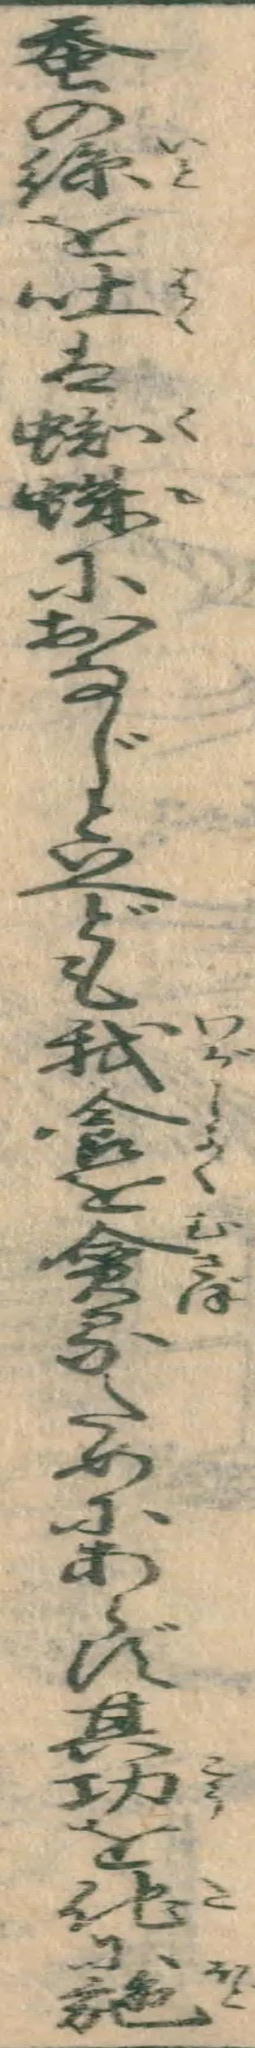蚕の糸を吐は蜘蛛におなじといへども我食を貪るためにあらず其功を他に施
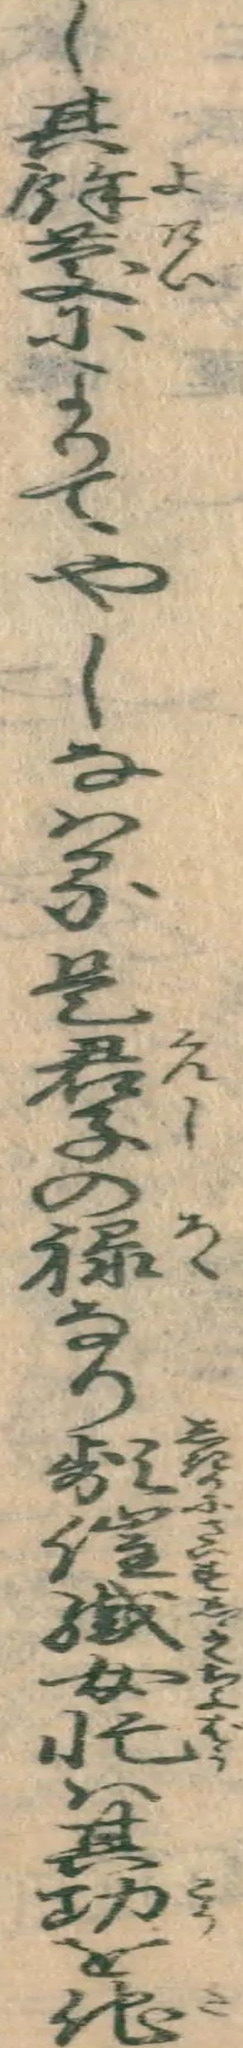し其余慶によりてやしなはる是君子の禄なり頻催織女忙は其功を他
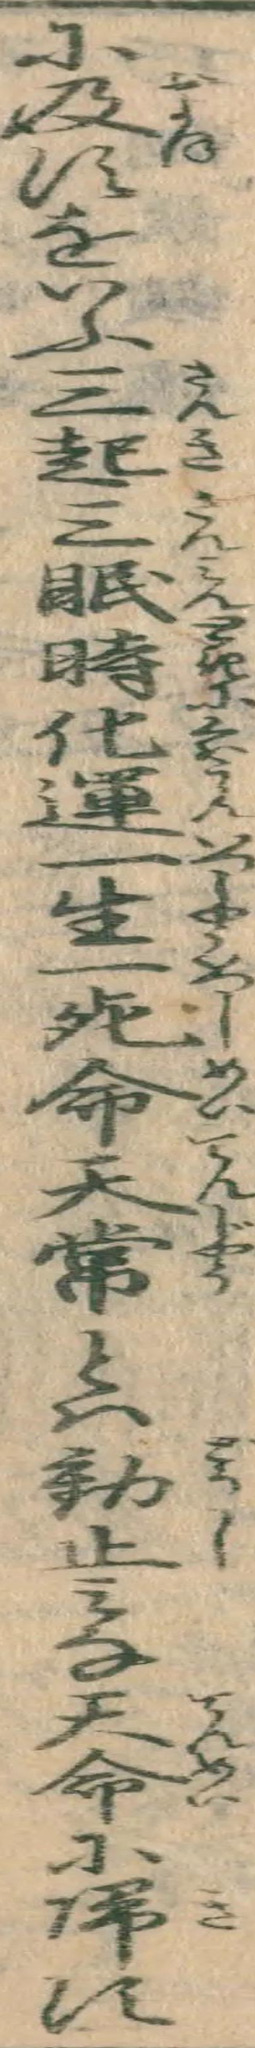に及すをいふ三起三眠時化運一生一死命天常とは動止みな天命に帰す
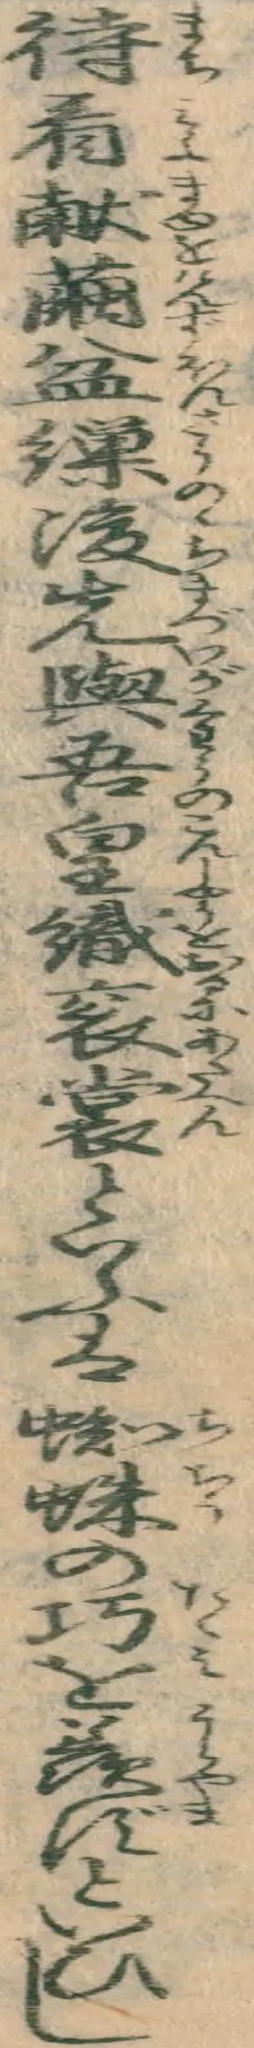待看献繭盆繅後先與吾皇織袞裳といふは蜘蛛の巧を羨ずといひし
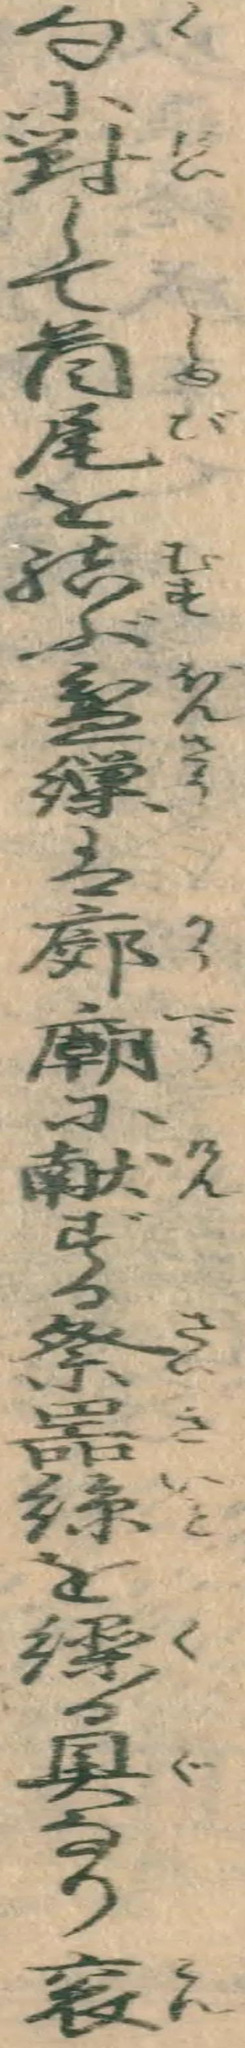句に対して首尾を結ぶ盆樔は郊廟に献ずる祭器糸を繰る具なり袞
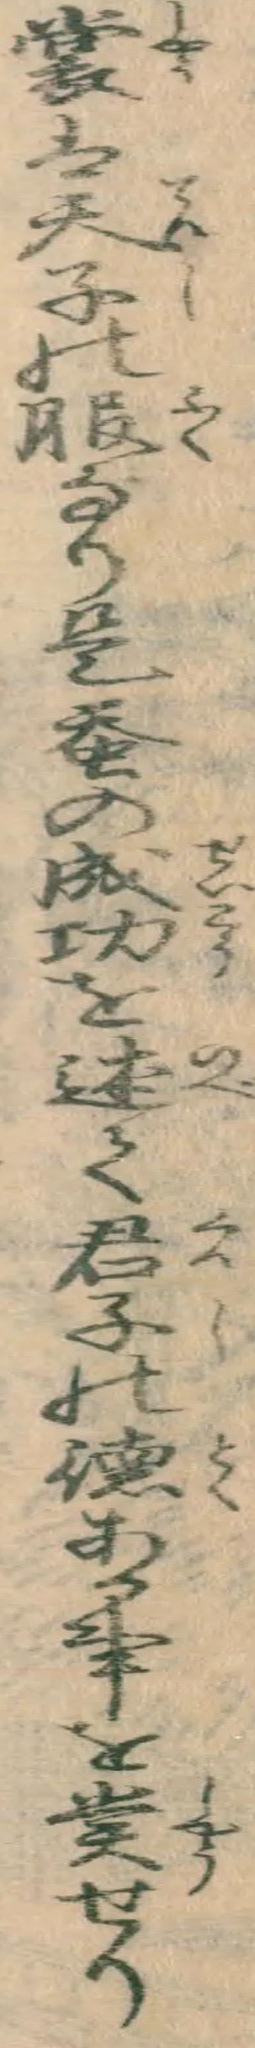裳は天子の服なり是蚕の成功を述て君子の徳ある事を賞せり
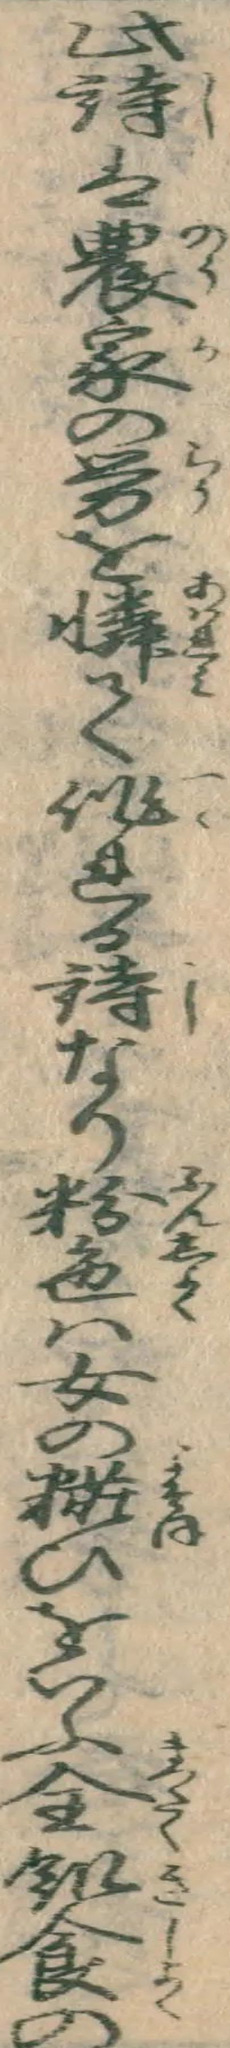此詩は農家の労を憐て作れる詩なり粉色は女の粧ひをいふ全飢食の
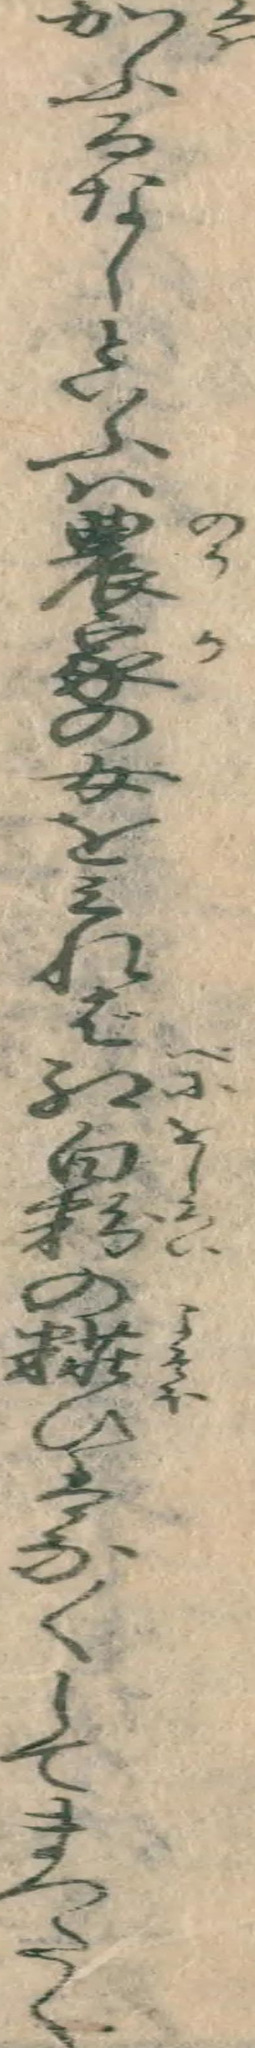加ふるなしといふは農家の女をみれば紅白粉の粧ひはなくしてまつたく
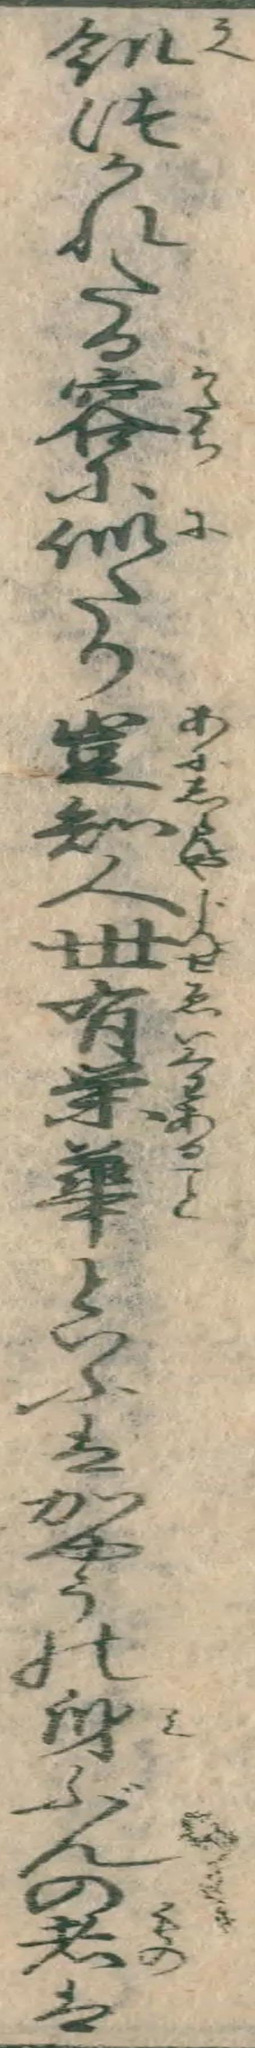飢つかれたる容に似たり豈知人世有栄華といふはかやうの身ぶんの者は
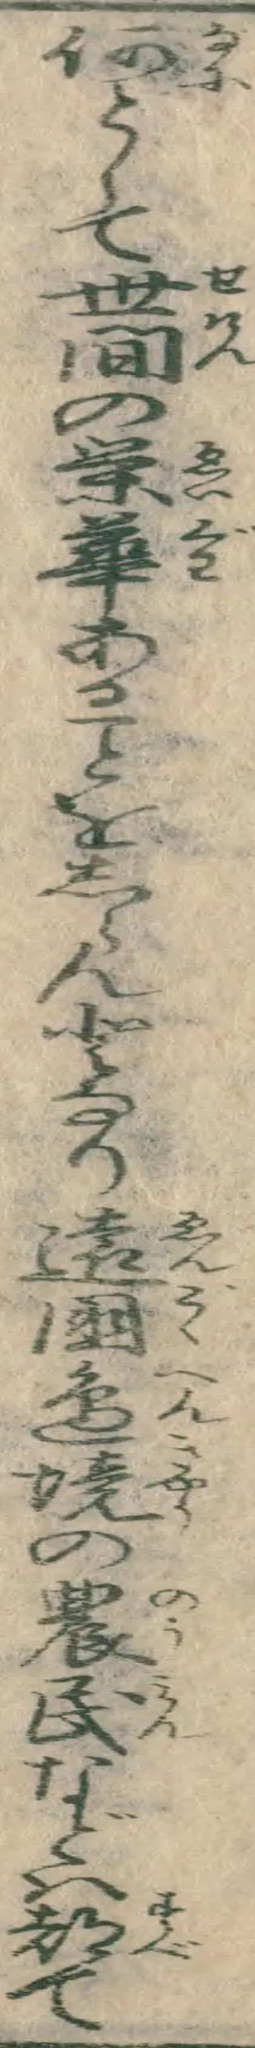何として世間の栄華あることをしらんとなり遠国辺境の農民などは都て
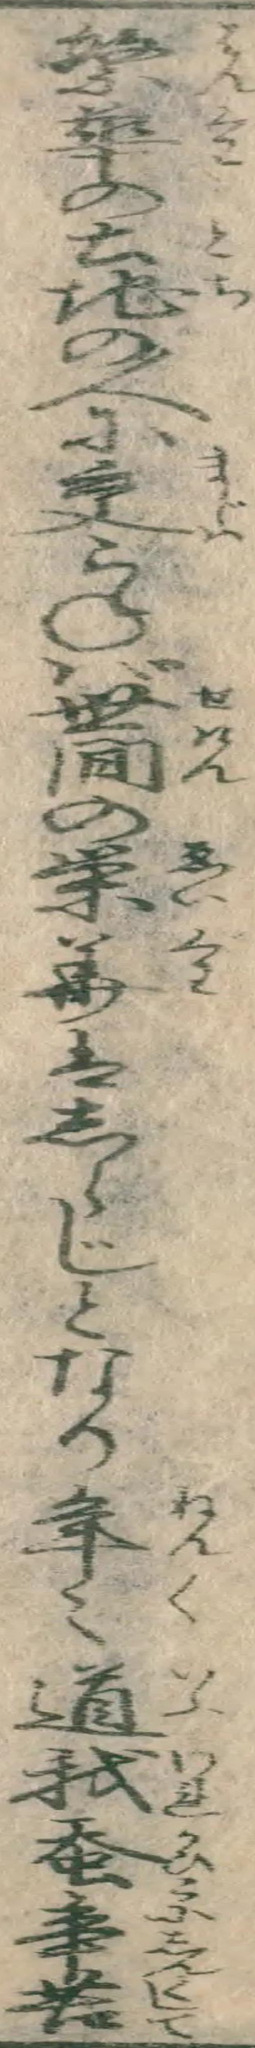繁華の土地の人に交らねば世間の栄華はしらじとなり年々道我蠶辛苦
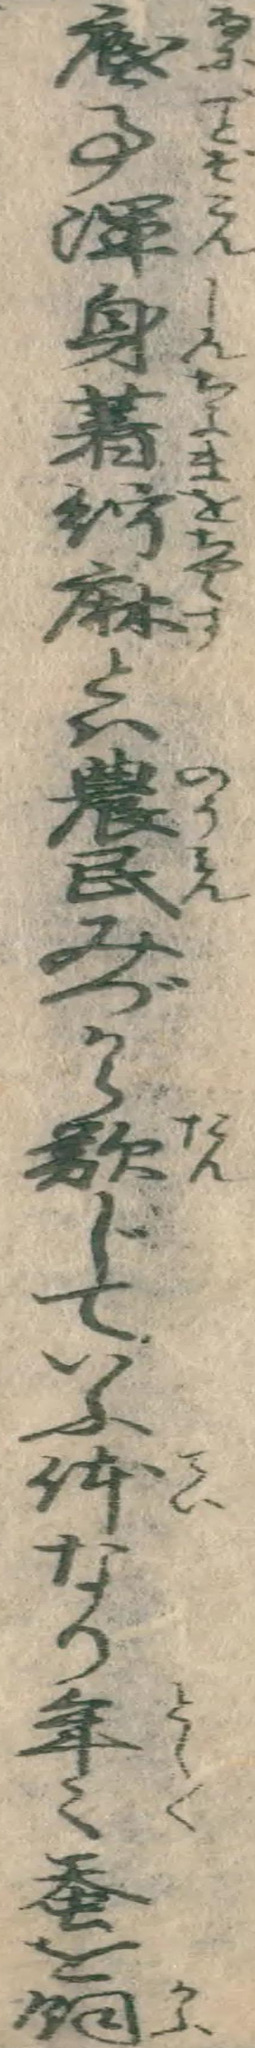底事渾身着紵麻とは農民みづから歎じていふ体なり年々蚕を飼
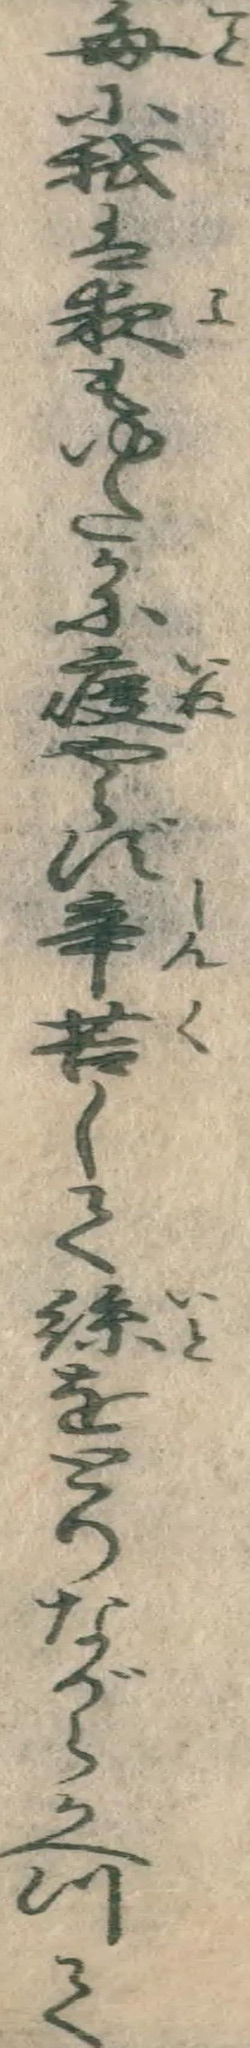毎に我は夜もゆたかに寝やらず辛苦して糸をとりながらかへつて
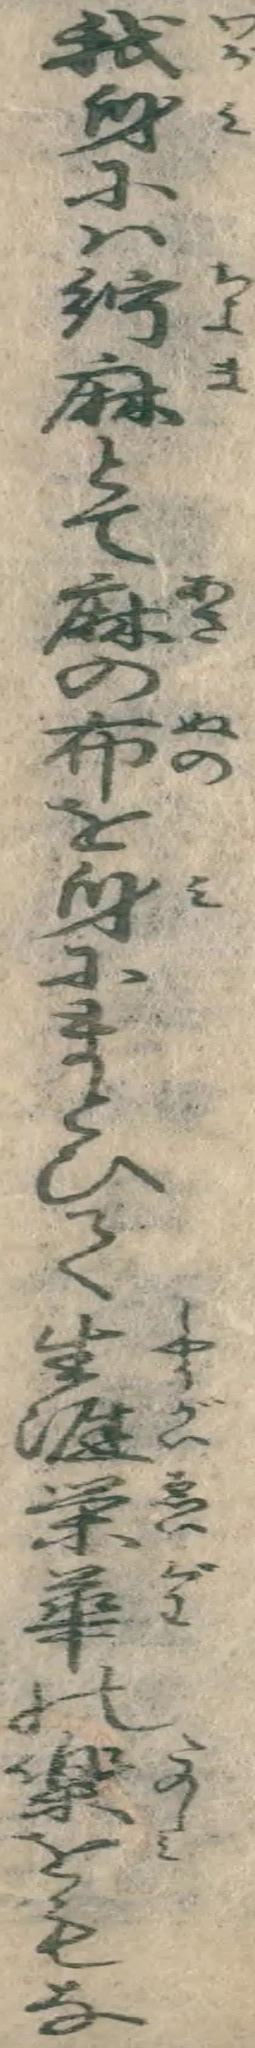我身には紵麻とて麻の布を身にまとひて生涯栄華の楽をもな
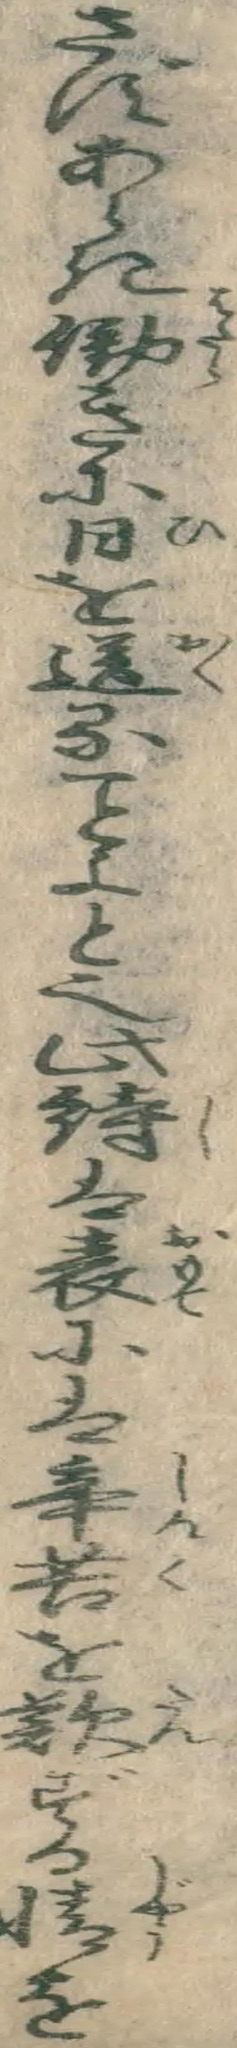さずあらき働きに日を送ることよと也此詩は表には辛苦を歎ずる情を
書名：養蚕秘録 3巻. [3]
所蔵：国立国会図書館 National Diet Library, JAPAN
